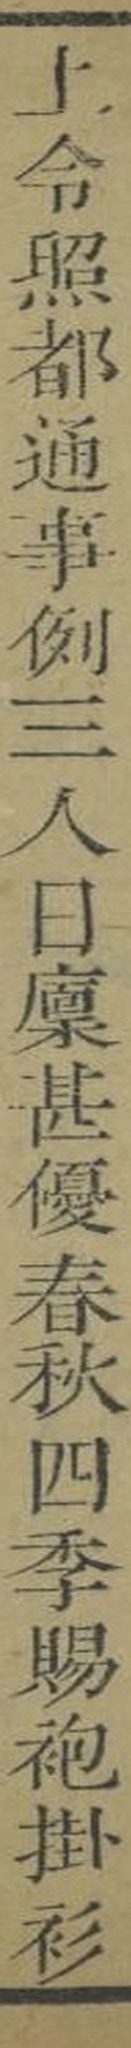上令照都通事例三人日廩甚優春秋四季賜袍掛衫
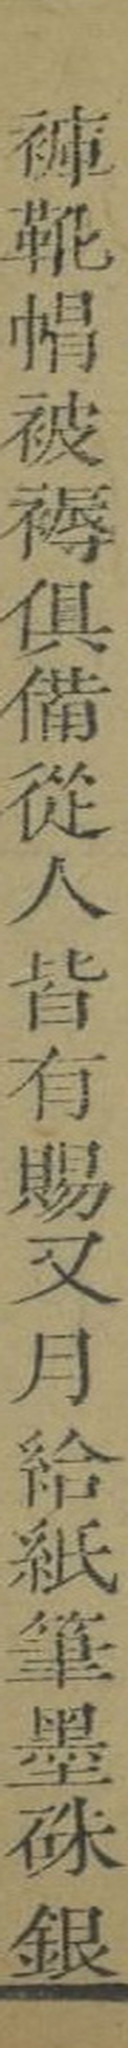褲靴帽被褥俱備従人皆有賜又月給紙筆墨硃銀
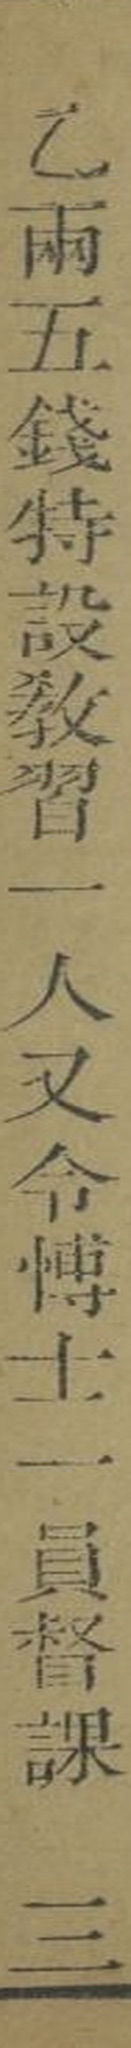乙両五銭特設教習一人又令博士一員督課三

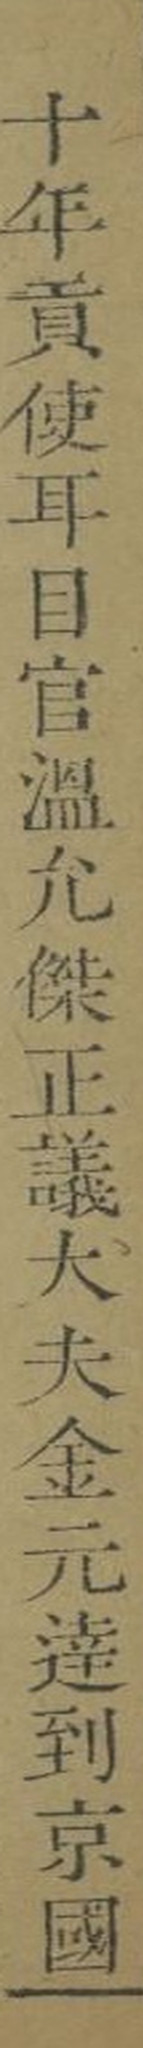十年貢使耳目官温允傑正議大夫金元達到京国
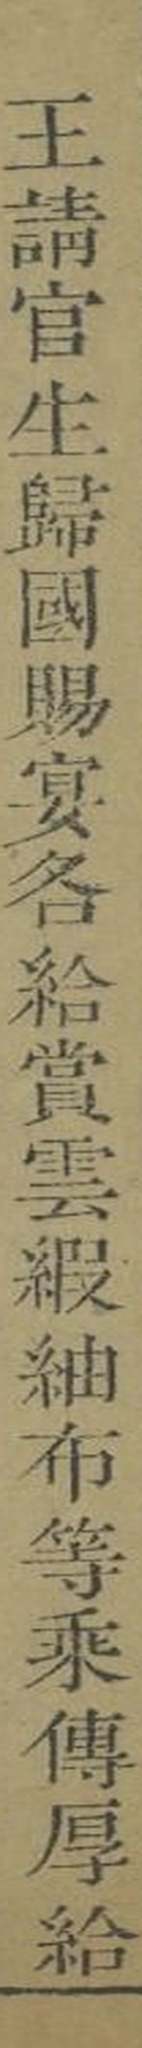王請官生帰国賜宴各給賞雲緞紬布等乗伝厚給
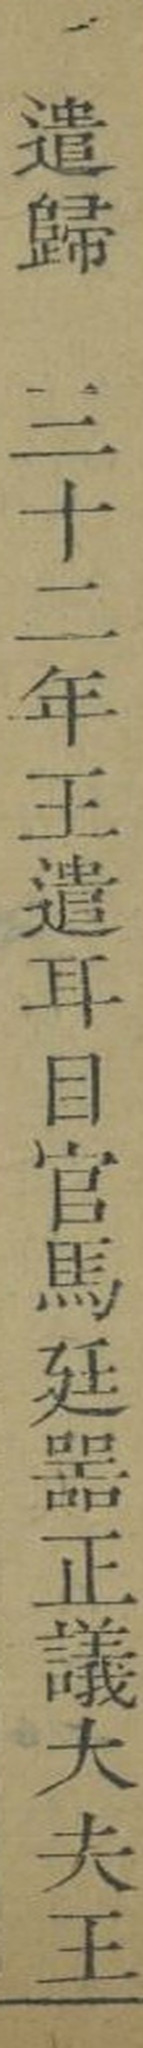遣帰三十二年王遣耳目官馬廷器正議大夫王
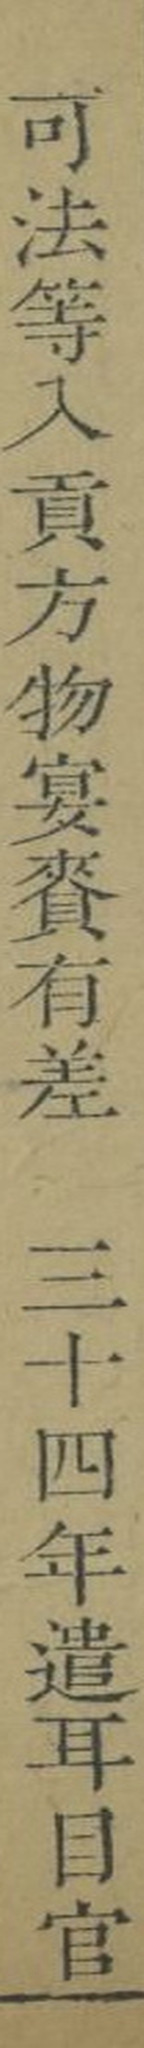可法等入貢方物宴賚有差三十四年遣耳目官
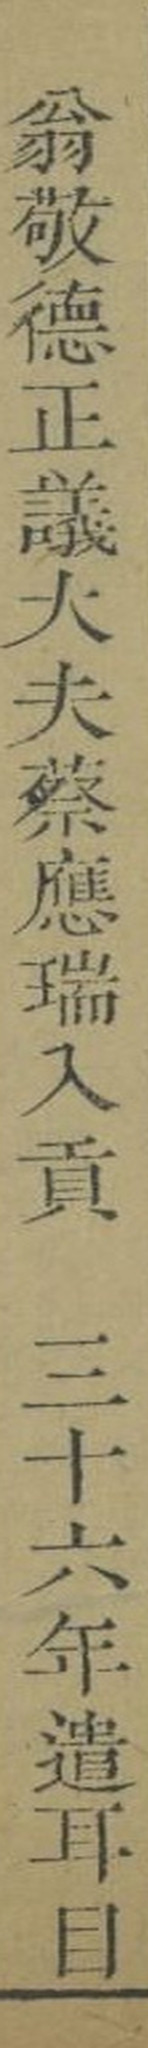翁敬徳正議大夫蔡応瑞入貢三十六年遣耳目
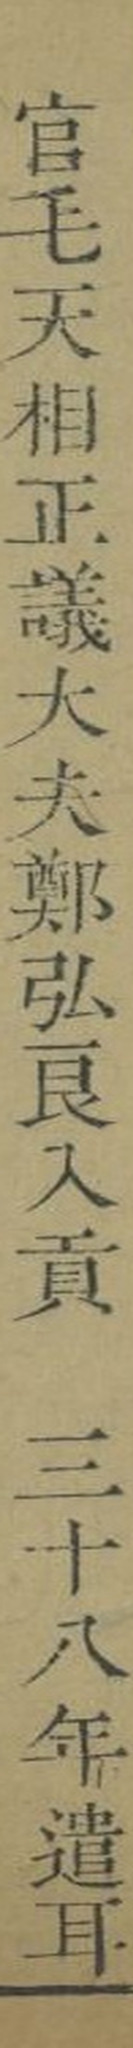官毛天相正議大夫鄭弘良入貢三十八年遣耳
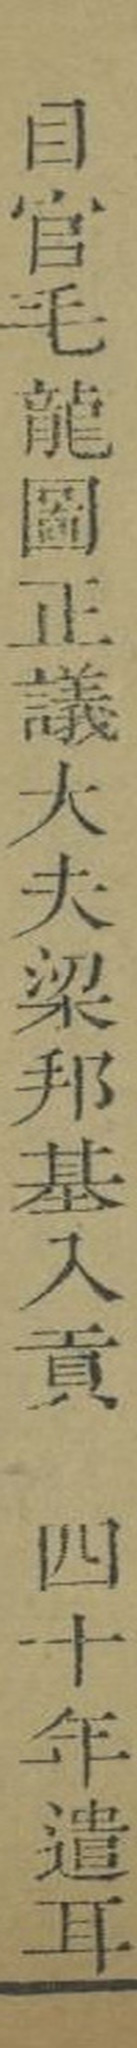目官毛竜図正議大夫梁邦基入貢四十年遣耳
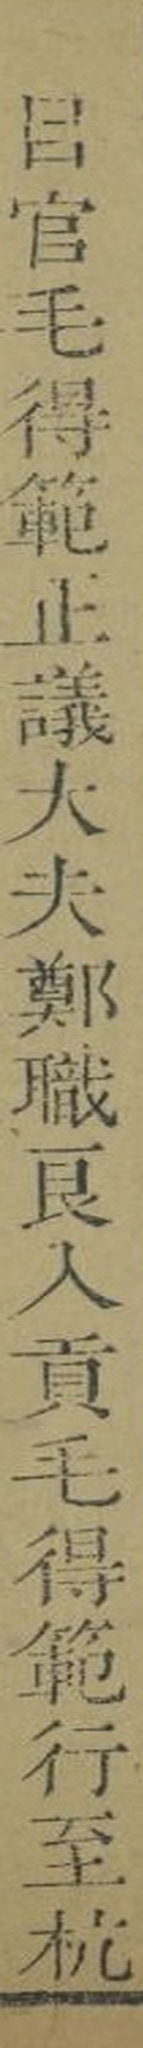目官毛得範正議大夫鄭職良入貢毛得範行至杭
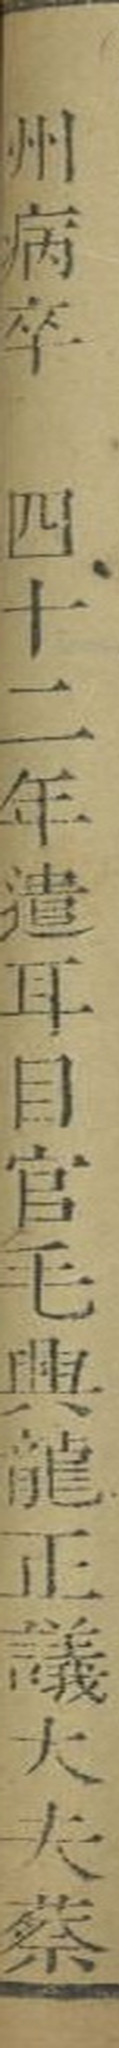州病卒四十二年遣耳目官毛興竜正議大夫蔡
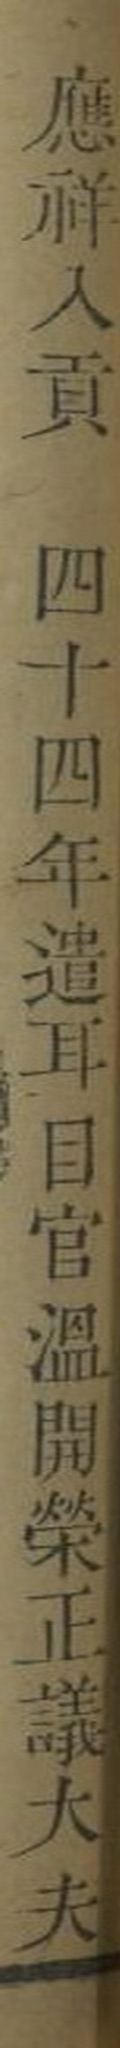応祥入貢四十四年遣耳目官温開栄正議大夫
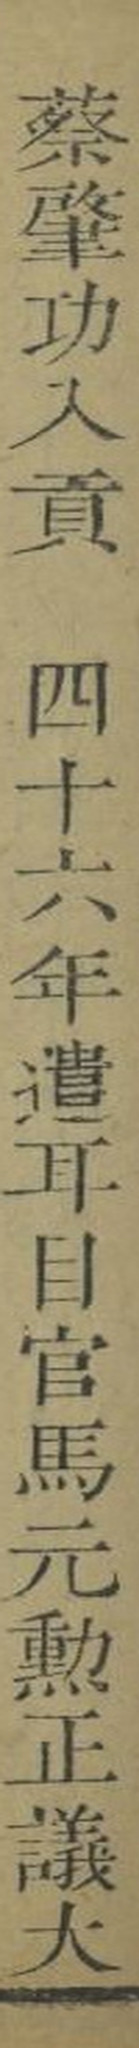蔡肇功入貢四十六年遣耳目官馬元勲正議大
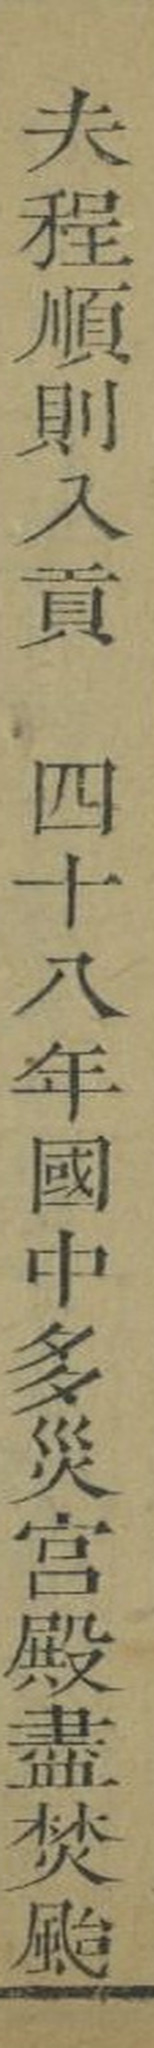夫程順則入貢四十八年国中多災宮殿尽焚颱
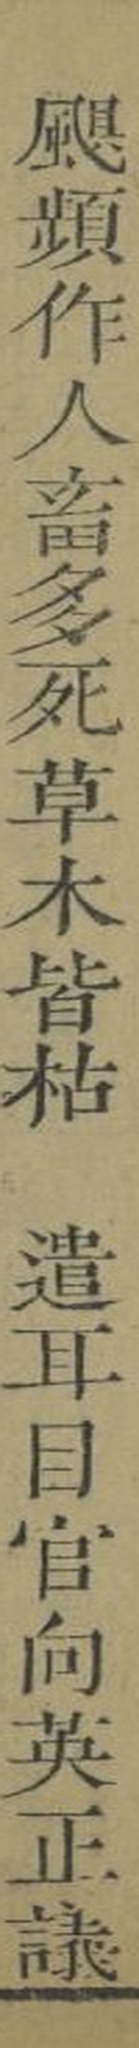颶頻作人畜多死草木皆枯遣耳目官向英正議
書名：中山伝信録 巻四
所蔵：University of the Ryukyus Library
